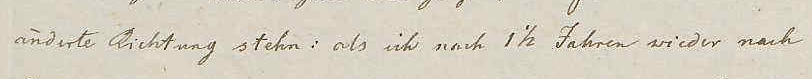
änderte Richtung stehn: als ich nach 1½ Jahren wieder nach
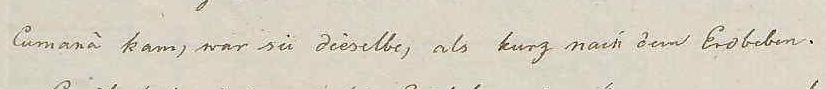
Cumanà kam, war sie dieselbe, als kurz nach dem Erdbeben.
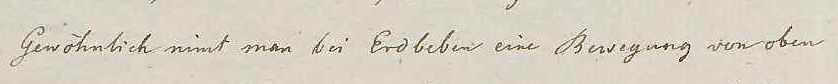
Gewöhnlich nimt man bei Erdbeben eine Bewegung von oben
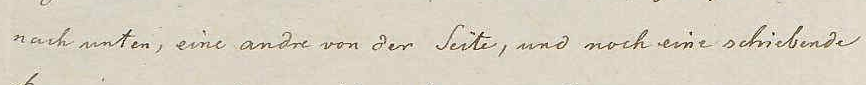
nach unten, eine andre von der Seite, und noch eine schiebende
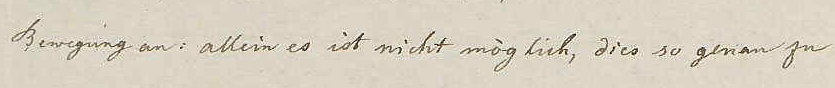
Bewegung an: allein es ist nicht möglich, dies so genau zu
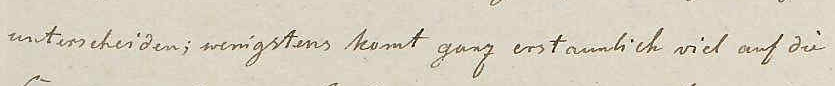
unterscheiden; wenigsten komt ganz erstaunlich viel auf die
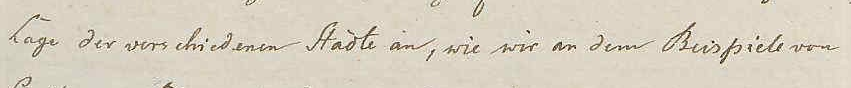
Lage der verschiedenen Städte an, wie wir an dem Beispiele von
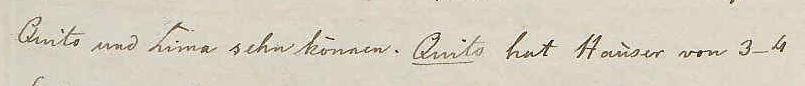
Quito und Lima sehn können. Quito hat Häuser von 3–4
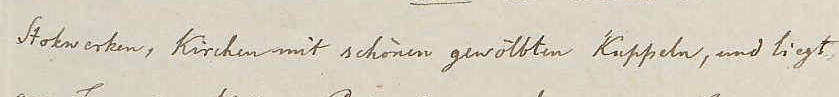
Stokwerken, Kirchen mit schönen gewölbten Kuppeln, und liegt
